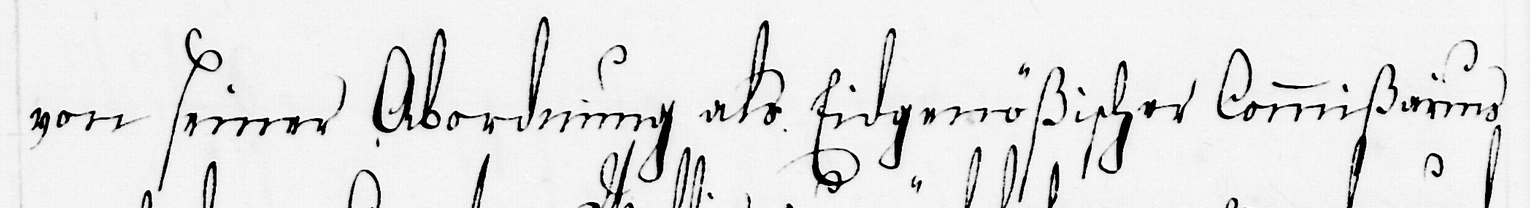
von seiner Abordnung als Eidgenößischer Commißarius
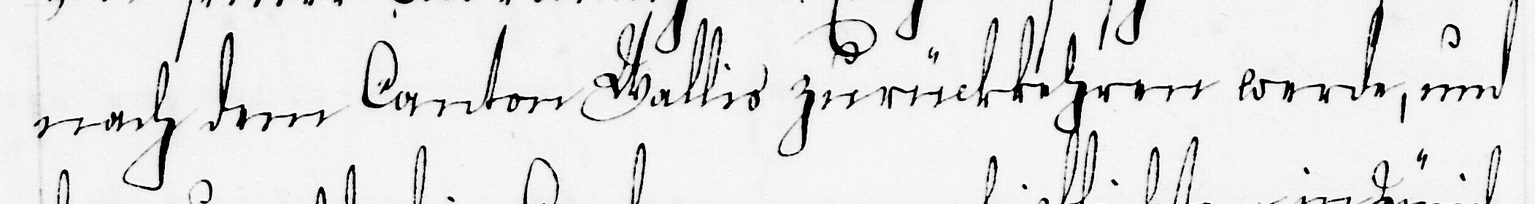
nach dem Canton Wallis zurückkehren werde, und
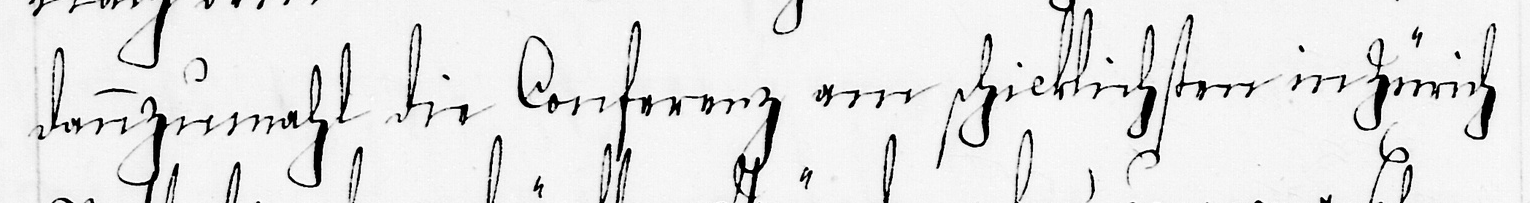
dannzumahl die Conferenz am schicklichsten in Zürich
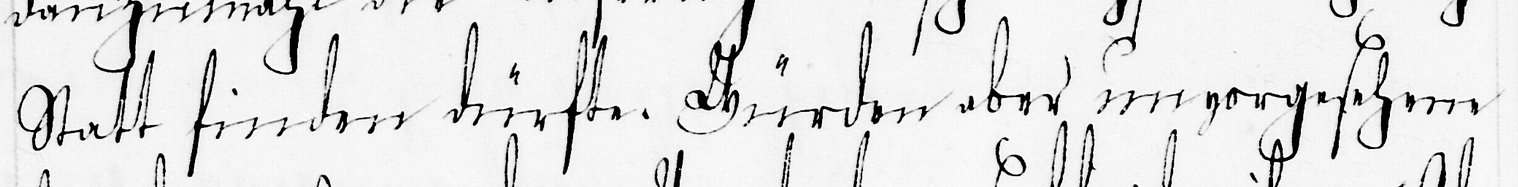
Statt finden dürfte. Würden aber unvorgesehene
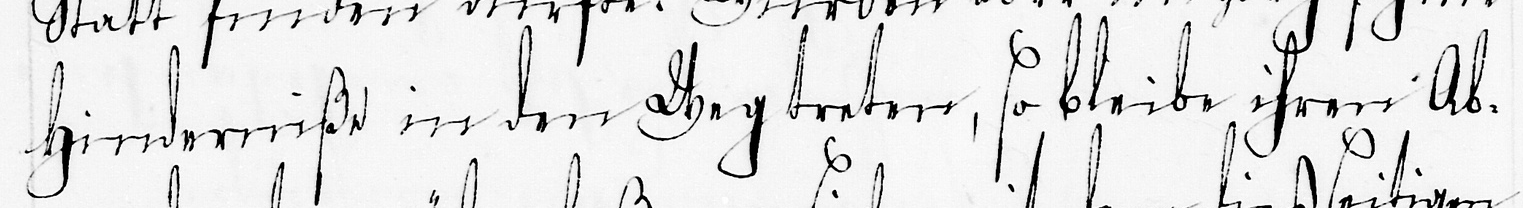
Hinderniße in den Weg treten, so bleibe ihren Ab¬
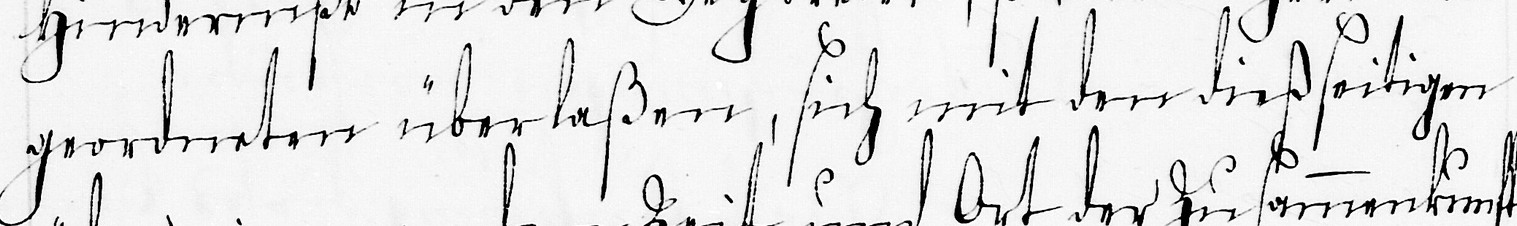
geordneten überlaßen, sich mit den dießseitigen
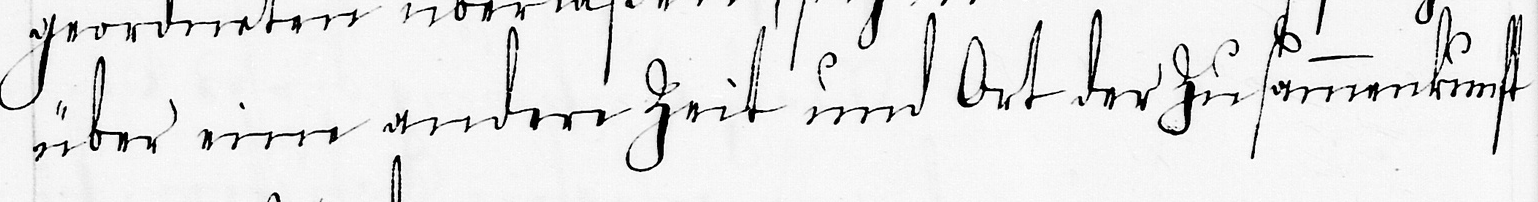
über eine andere Zeit und Art der Zusammenkunft
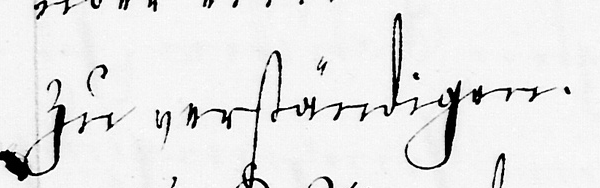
zu verständigen.
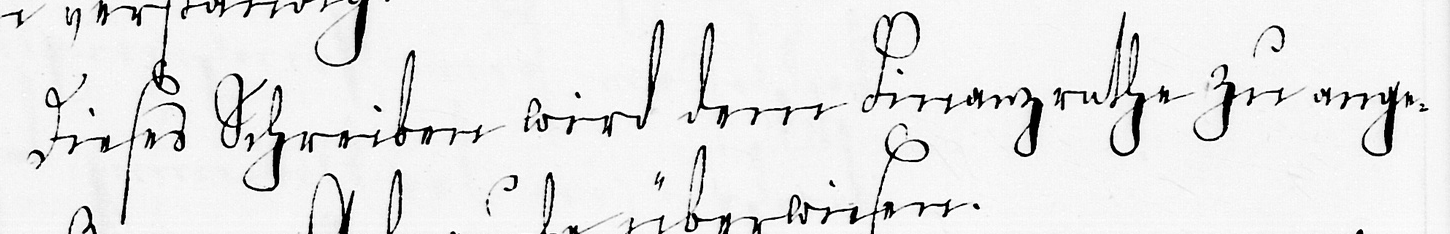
Dieses Schreiben wird dem Finanzrathe zu ange¬
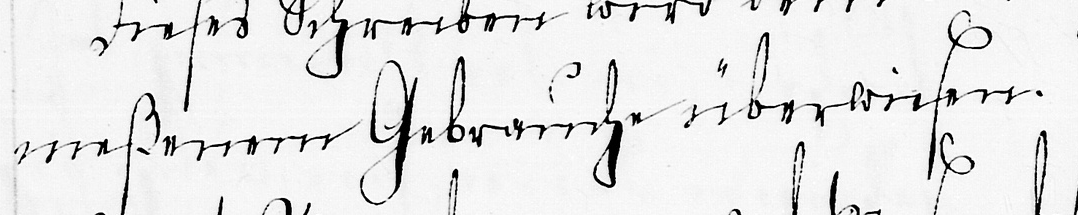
meßenem Gebrauche überwiesen.
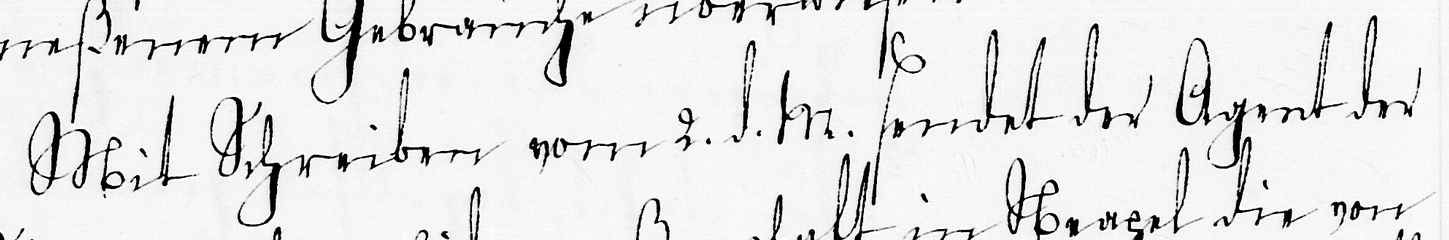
Mit Schreiben vom 2. d. M. sendet der Agent der
